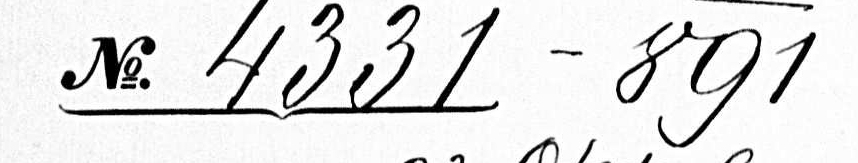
No. 4331 - 1891
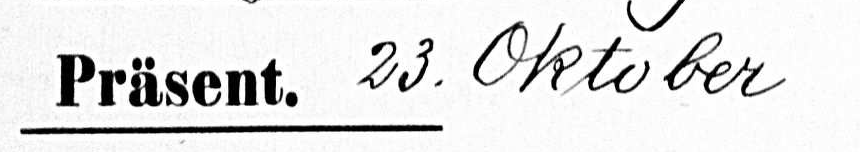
Präsent. 23. Oktober
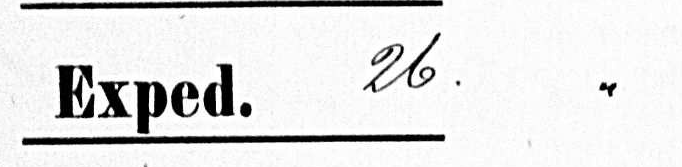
Exped. 26. „
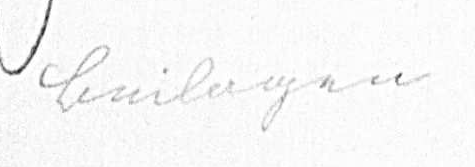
Beilagen
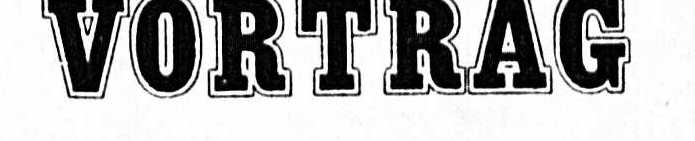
Vortrag
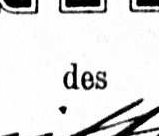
des
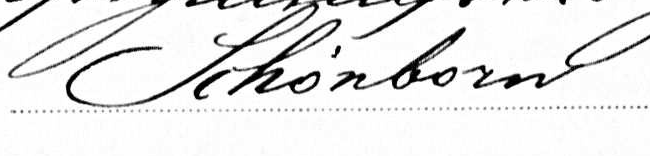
Schönborn
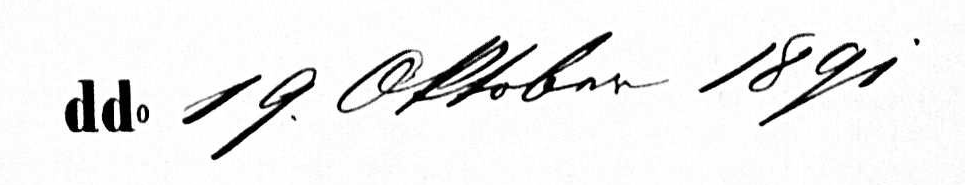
ddo 19. Oktober 1891
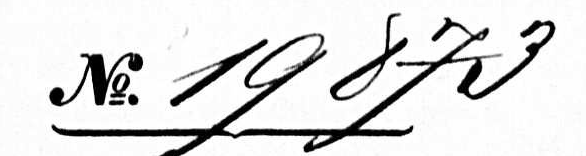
No. 19873
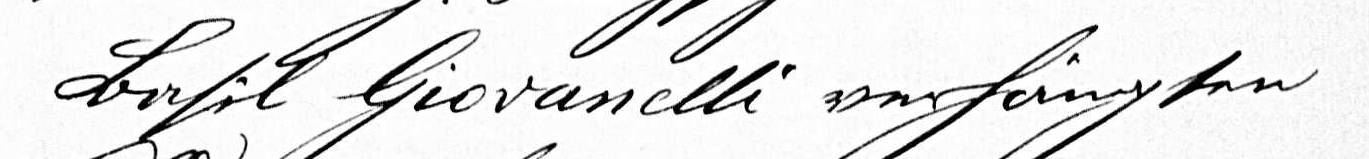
Basil Giovanelli verhängten
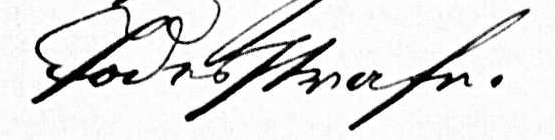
Todesstrafe.
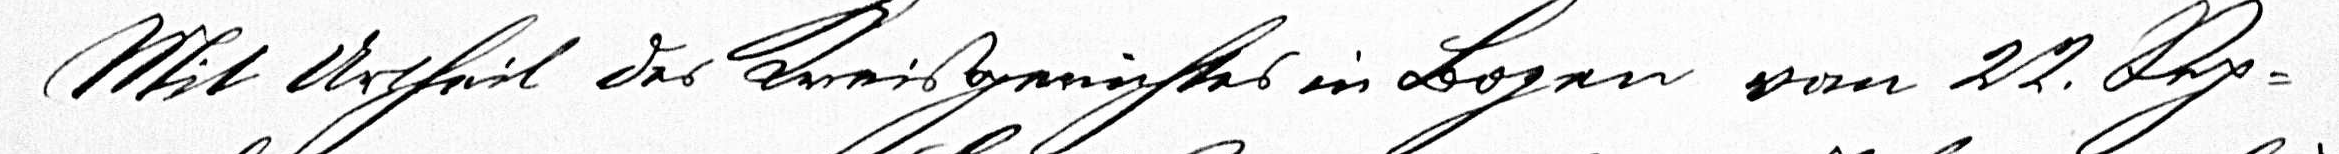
Mit Urtheil des Kreisgerichtes in Bogen von 22. Sep¬
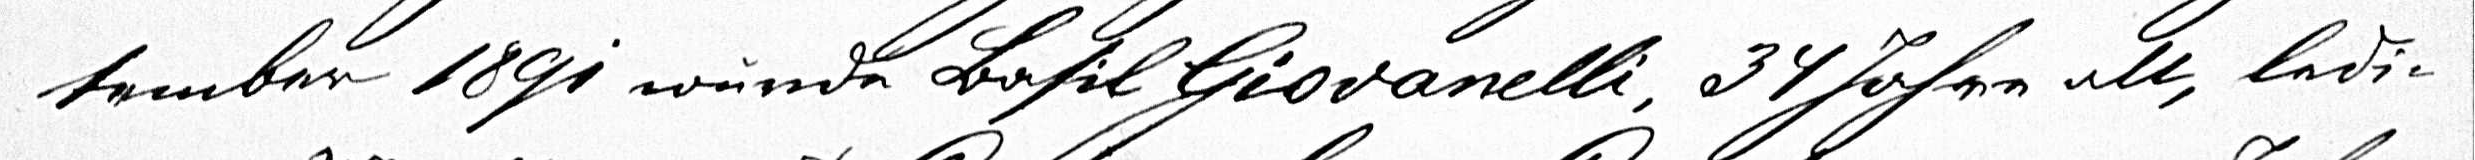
tember 1891 wurde Basil Giovanelli, 34 Jahre alt, ledi¬
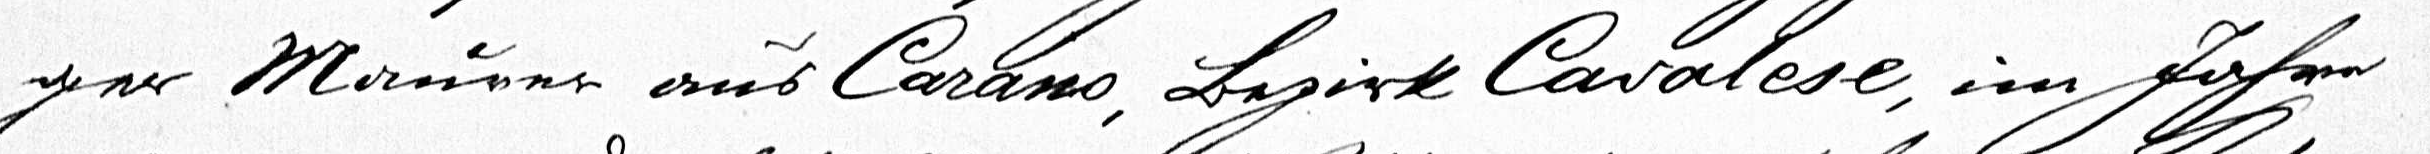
ger Maurer aus Carano, Bezirk Cavalese, im Jahre
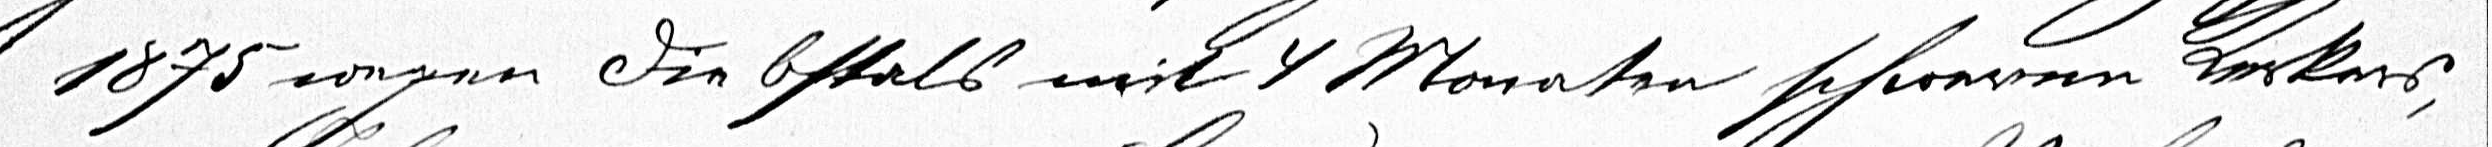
1875 wegen diebstals mit 4 Monate schweren Kerkers
